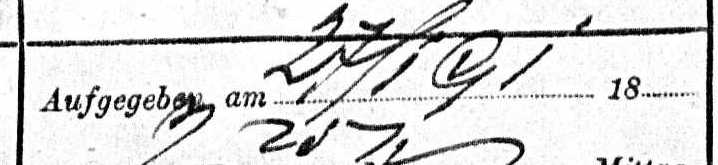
Aufgegeben am............. 27/191...................18....
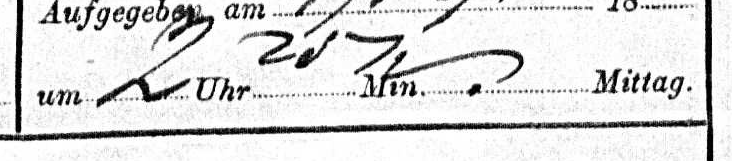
um .........2......Uhr.....xx.....Min..............Mittag.
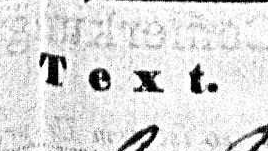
Text.
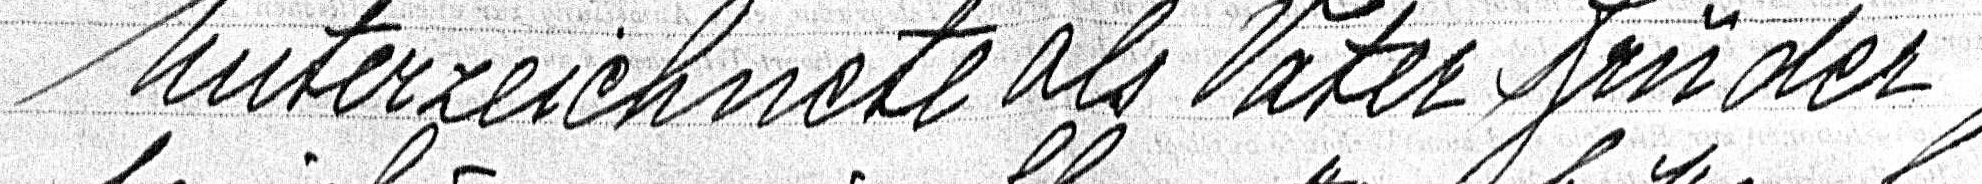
Unterzeichnete als Vater Brüder
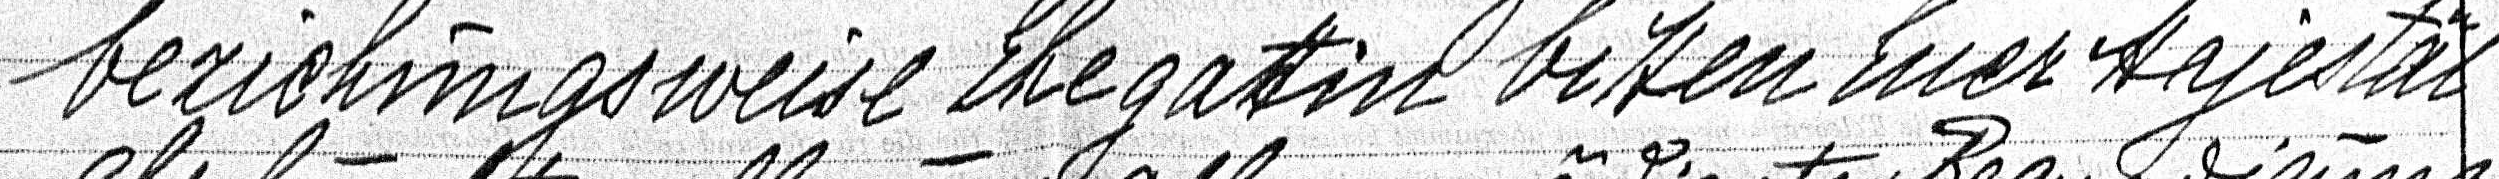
beziehungsweise Ehegattin bitten Euer Majestät
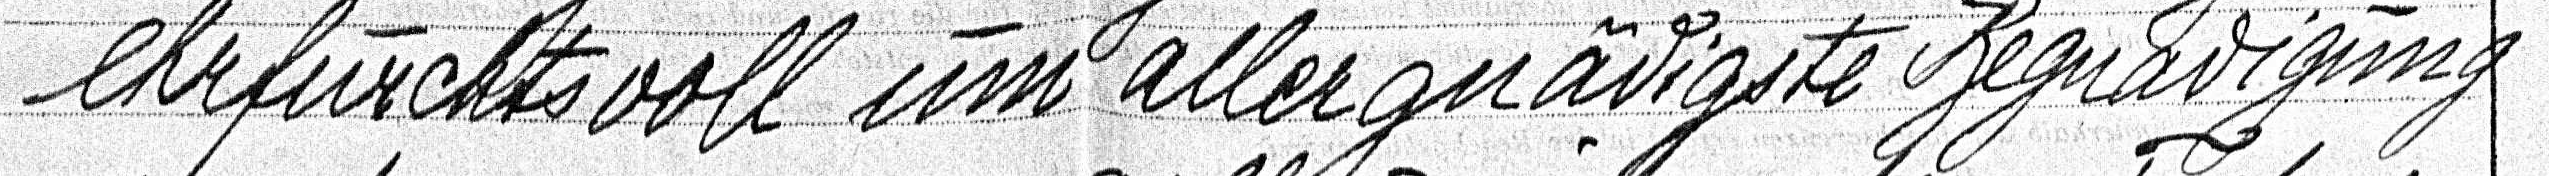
ehrfurchtsvoll um allergnädigste Begnadigung
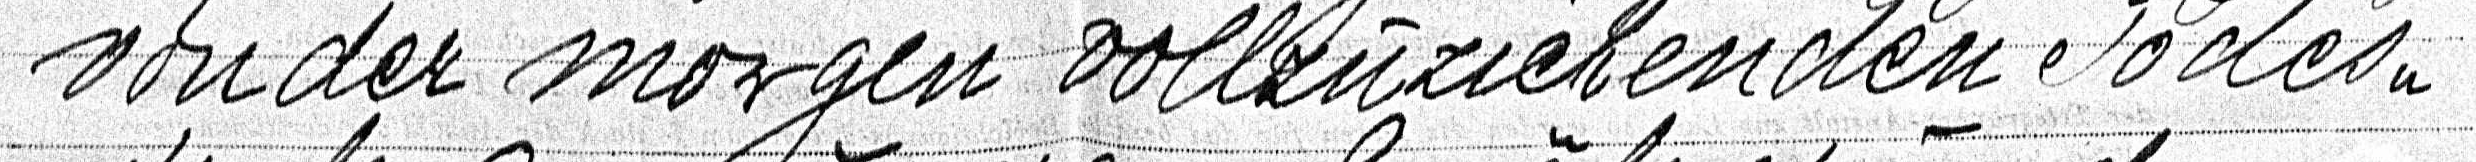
von der morgen vollzuziehenden Todes¬
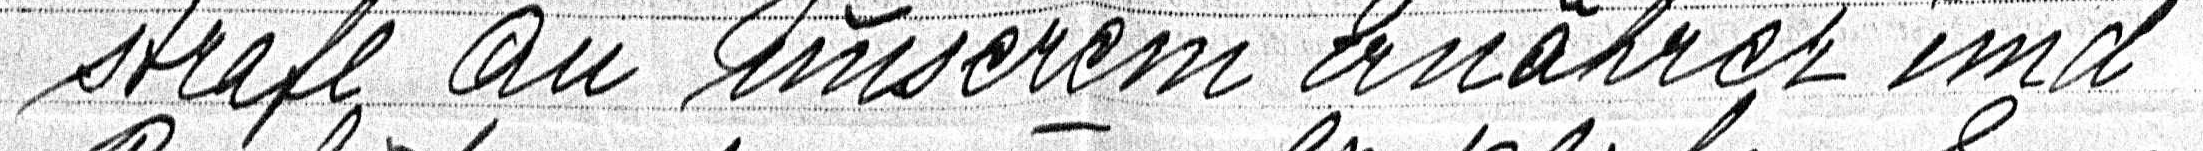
strafe an unserem Ernährer und
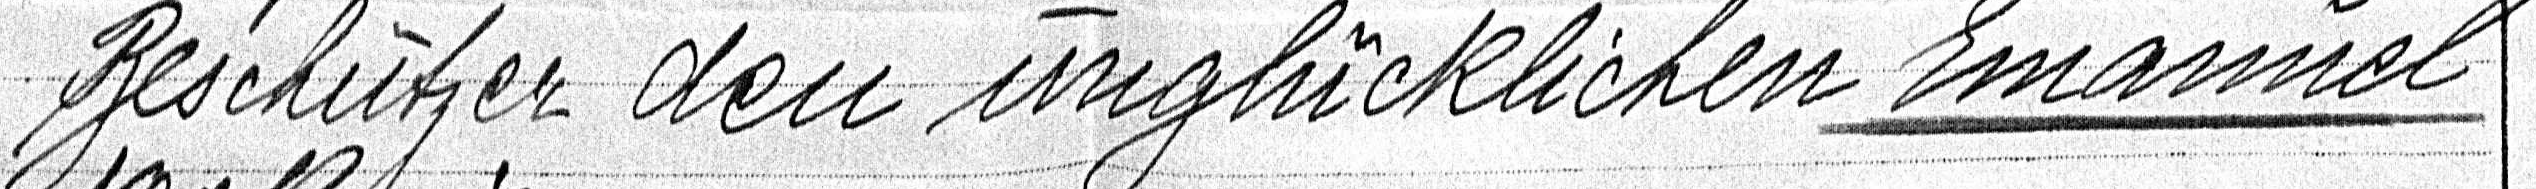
Beschützer den unglücklichen Emanuel
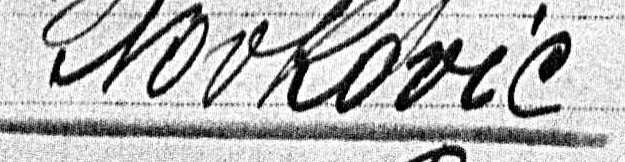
Novkovic
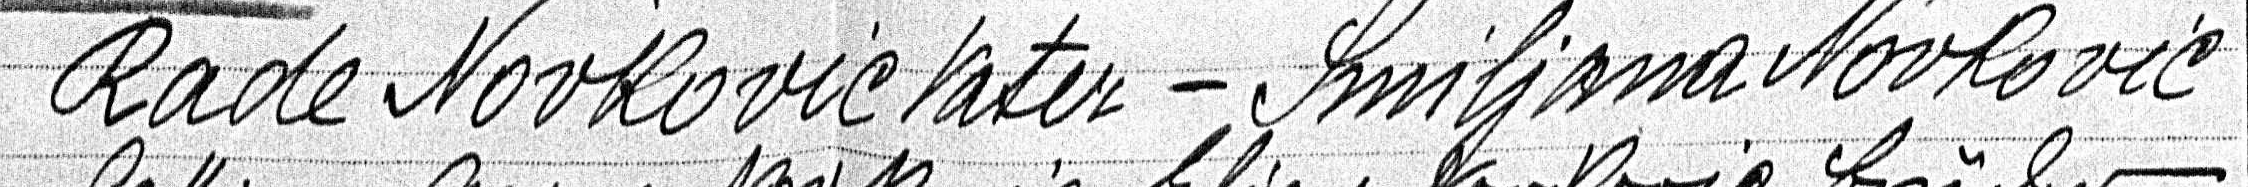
Rade Novkovic Vater - Smiljana Novkovic
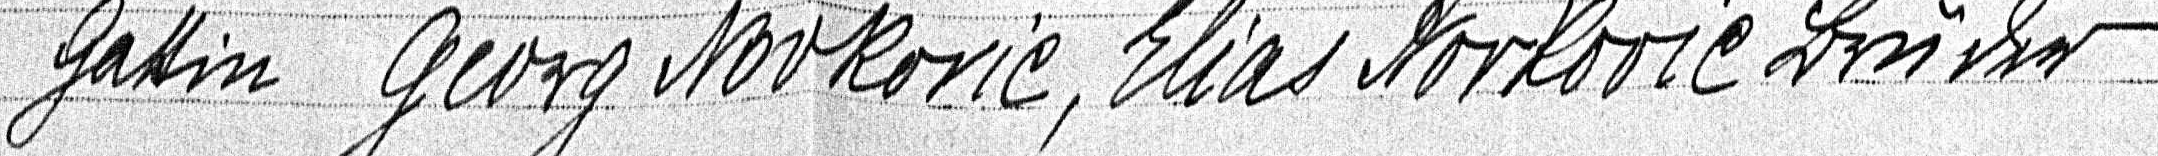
Gattin Georg Novkovic, Elias Novkovic Brüder
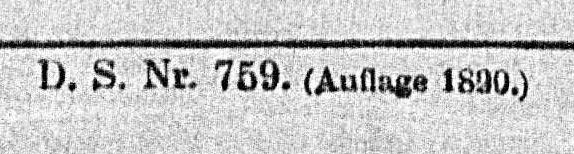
D. S. Nr. 759. (Auflage 1890.)
